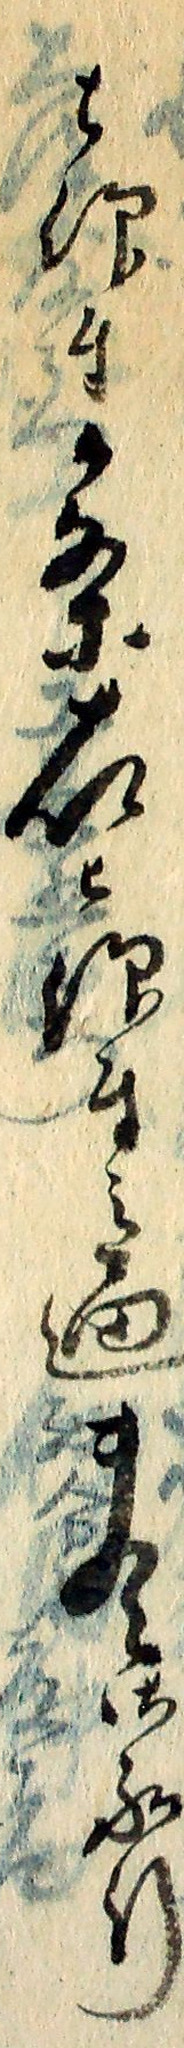被仰付候条右被仰付之通夫々御承引
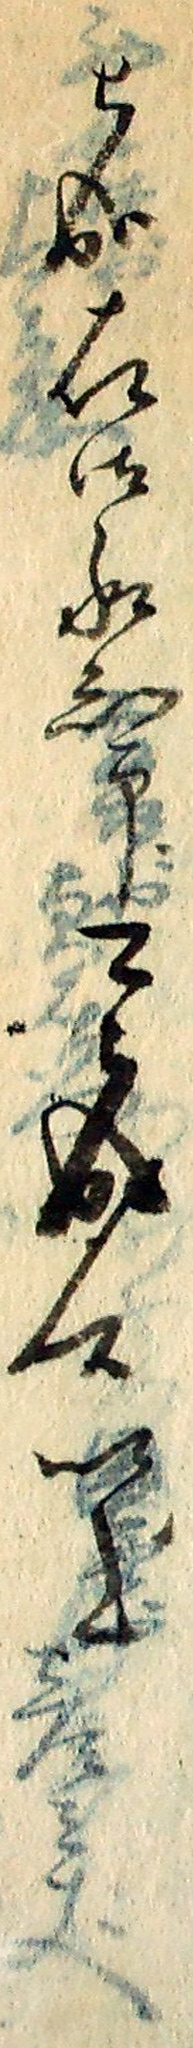被成右御承知印可被成候以上
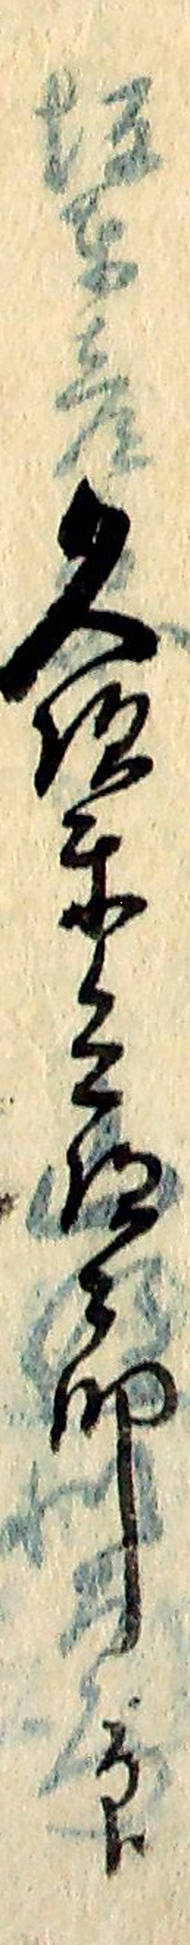久須米兵次郎印
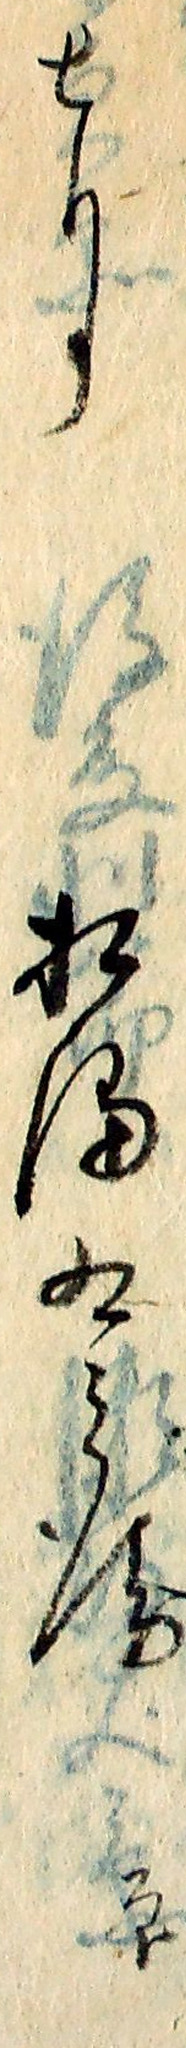七月松浦九兵衛印
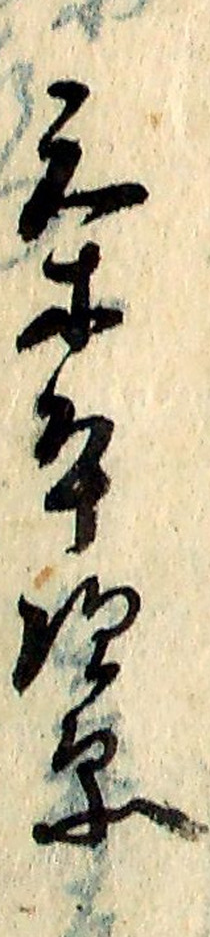元木平次兵衛印
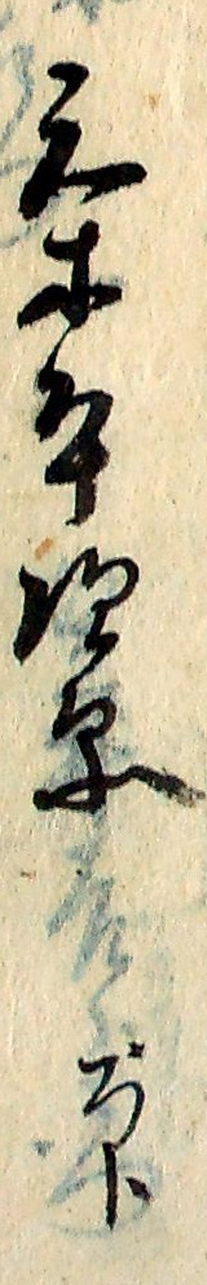元木平次兵衛印

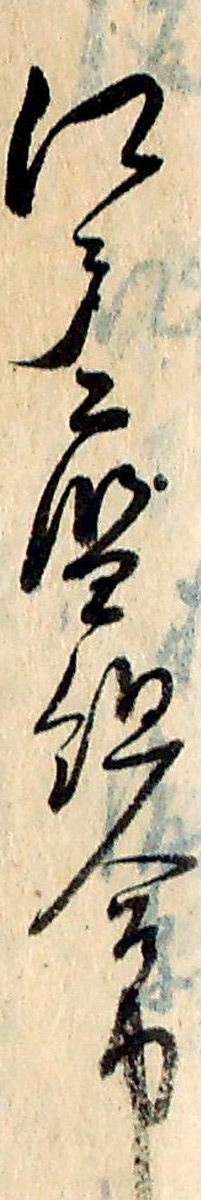江戸藍組合中
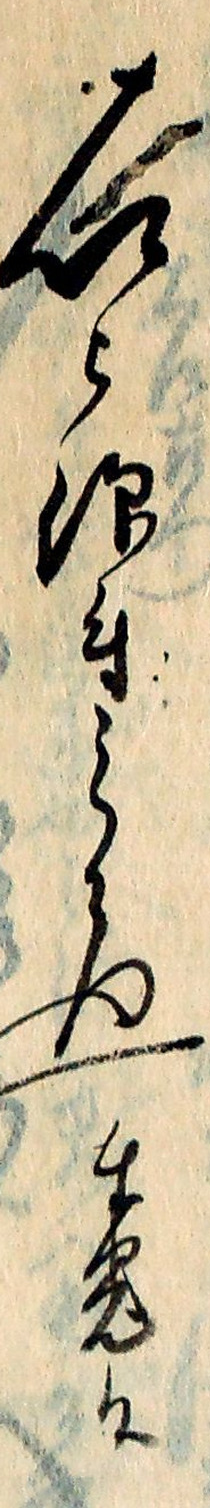右被仰付之通奉究候
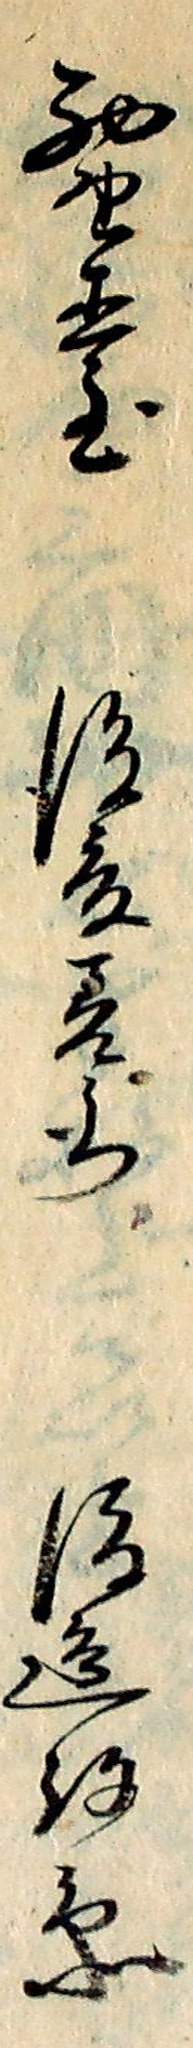西野直蔵後藤善右衛門渡辺弥兵衛
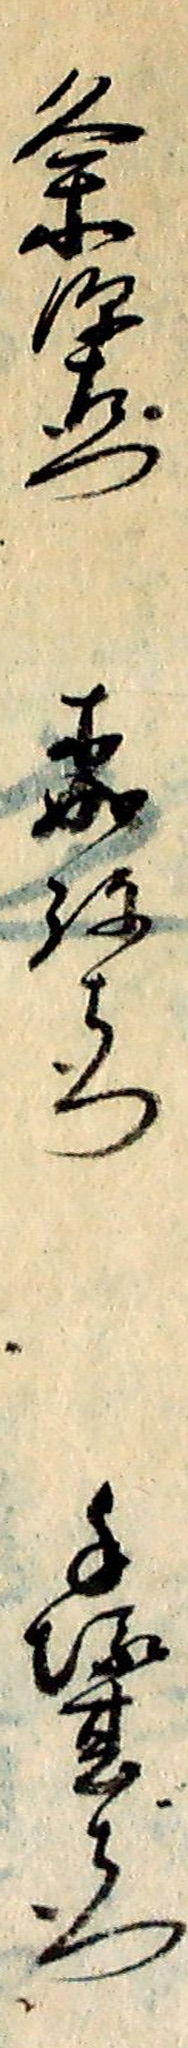久米源左衛門森弥右衛門手塚甚右衛門
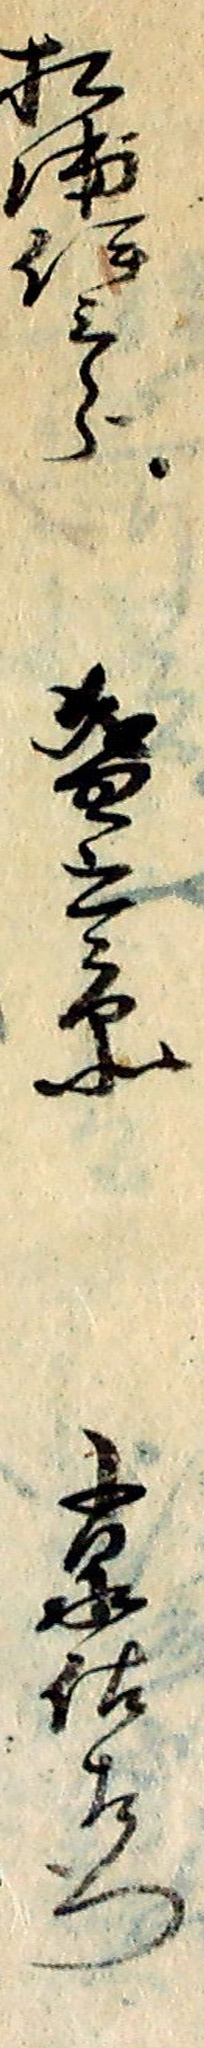松浦伊三郎盛六兵衛小泉佐左衛門
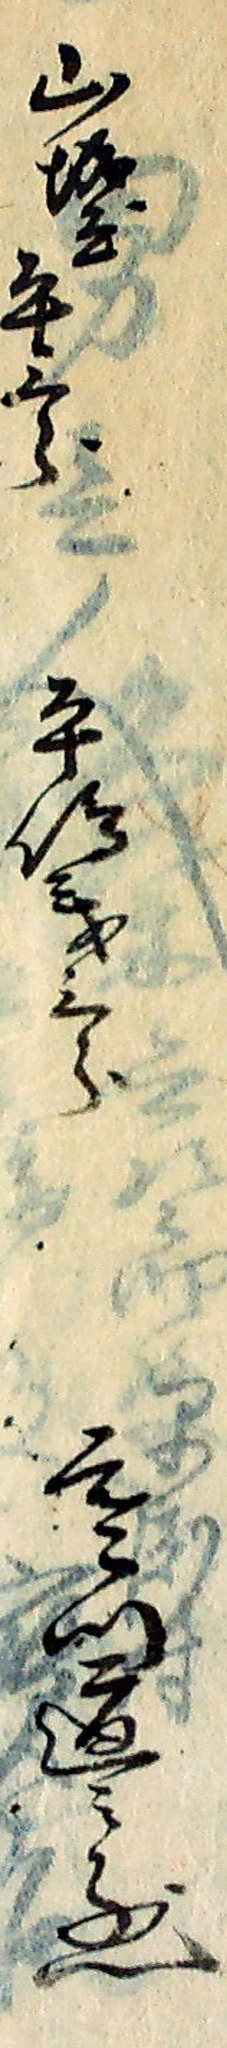山城屋平三郎平島義三郎寒川道之丞
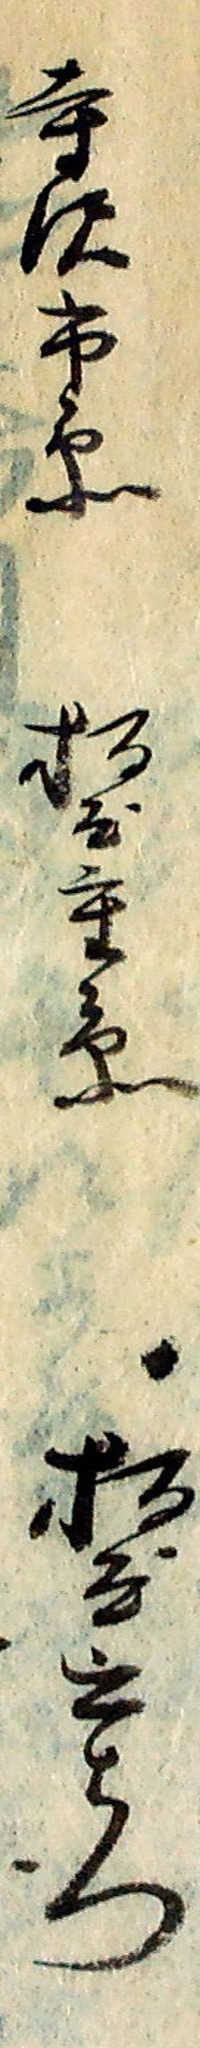寺沢市兵衛板屋重兵衛板屋六右衛門
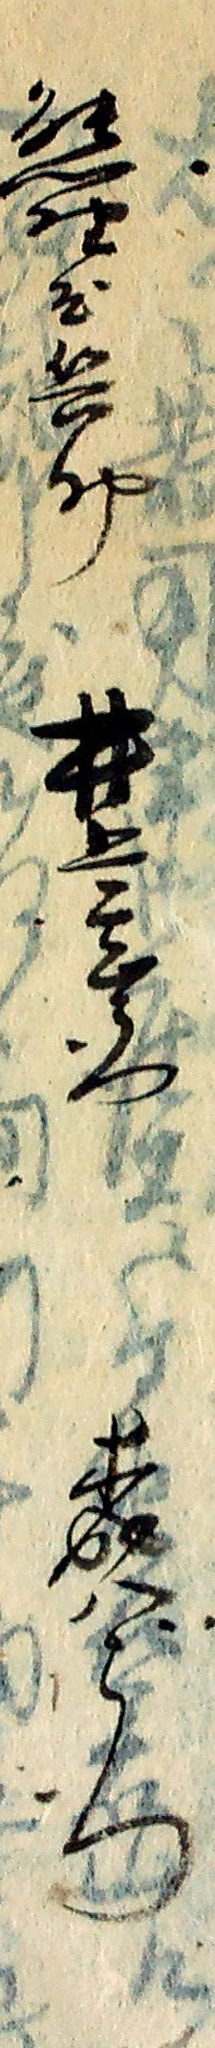熊野屋兵助井上甚右衛門森八右衛門
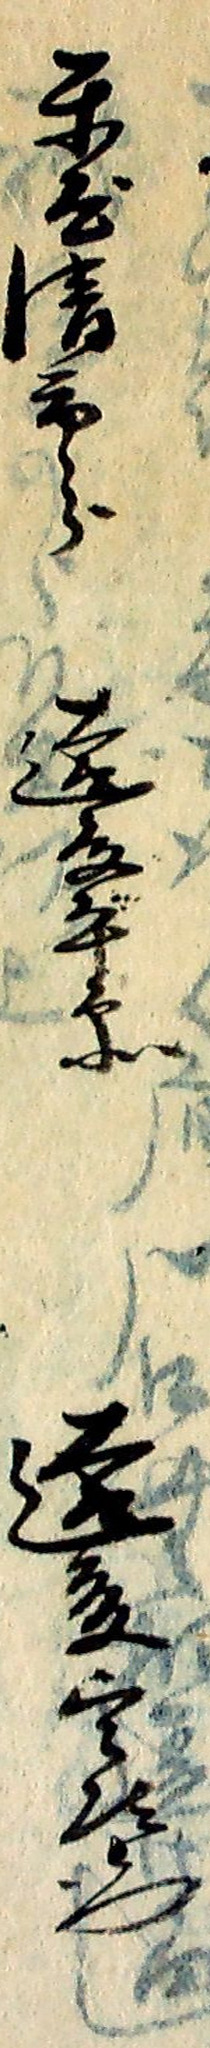楽屋清市郎遠藤平兵衛遠藤宇次右衛門
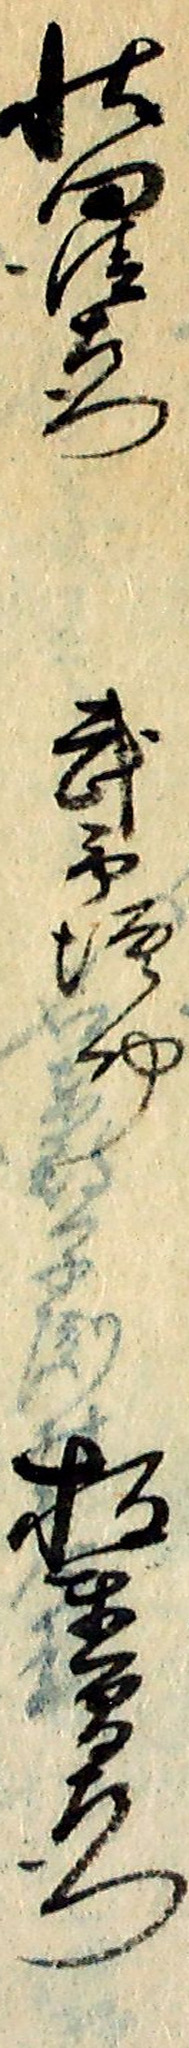杖田清左衛門武市増助板末曽左衛門
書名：諸御願書控(後藤氏壱番）
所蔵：鳴門教育大学 Naruto University of Education
